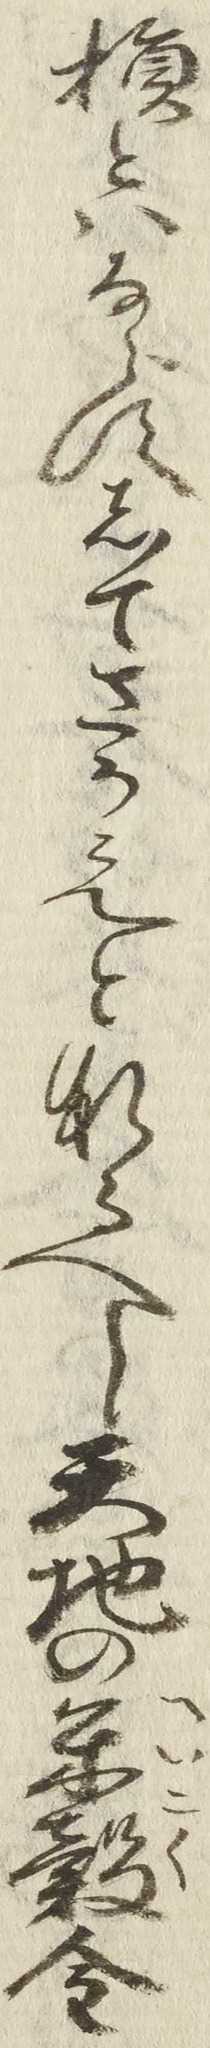損とはならすしてさかえとなるへし天地の米穀金
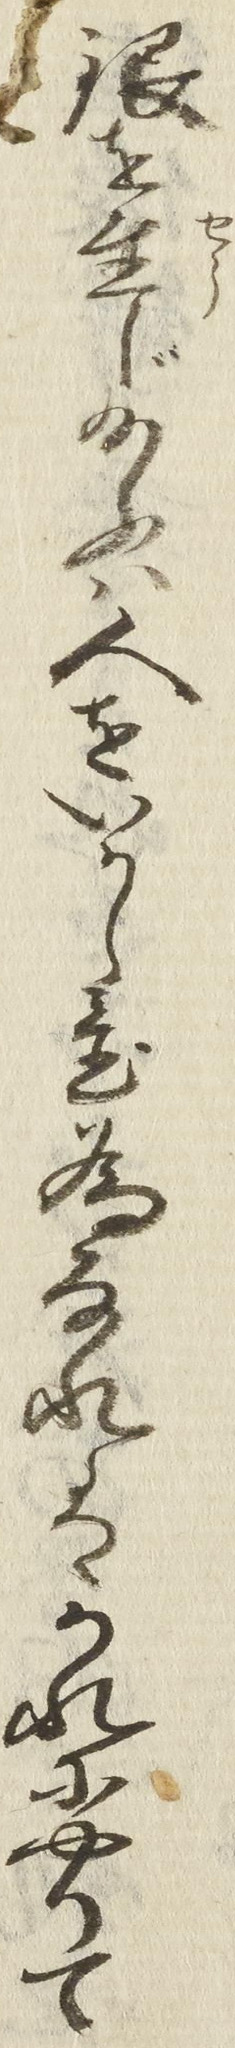銀を生じ給ふは人をいかし置為なれはかれにやりて
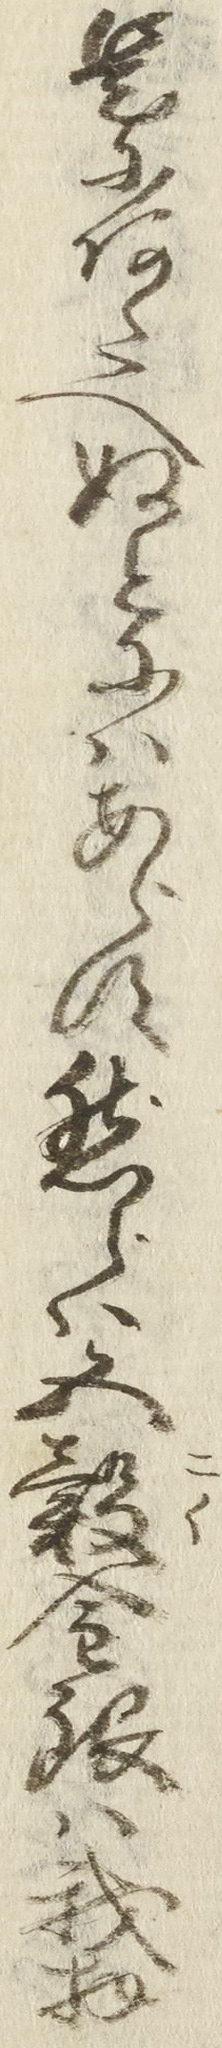是にあたへぬとにはあらす然らは五穀金銀は我物
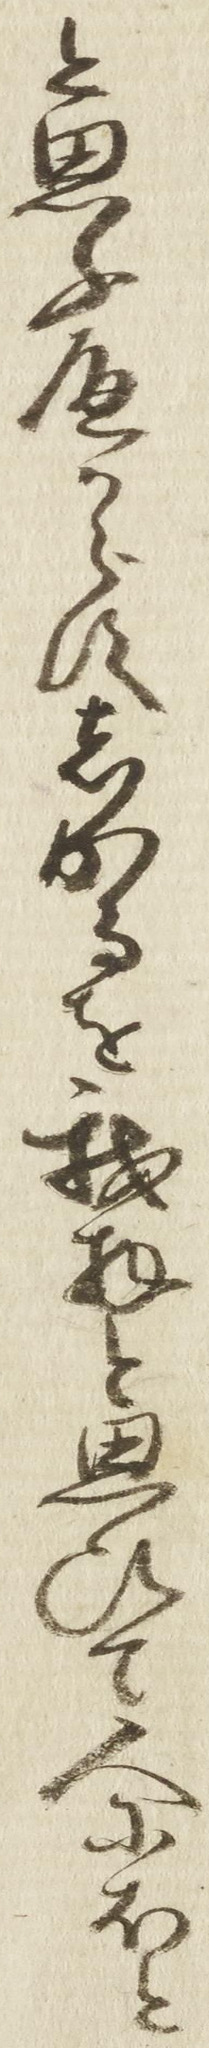と思ふへからすしかるを我物と思ひて人にほと
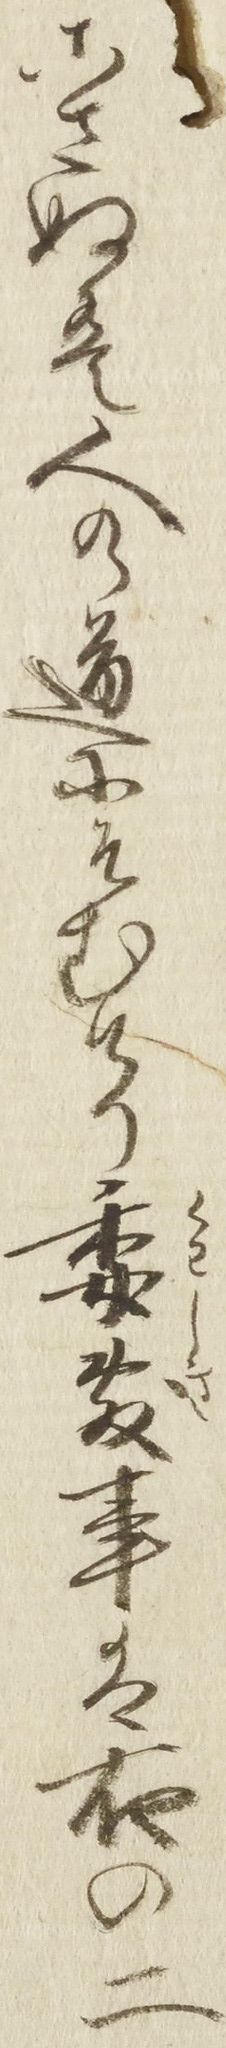こさぬは人の道にそむけり委敷事は右のニ
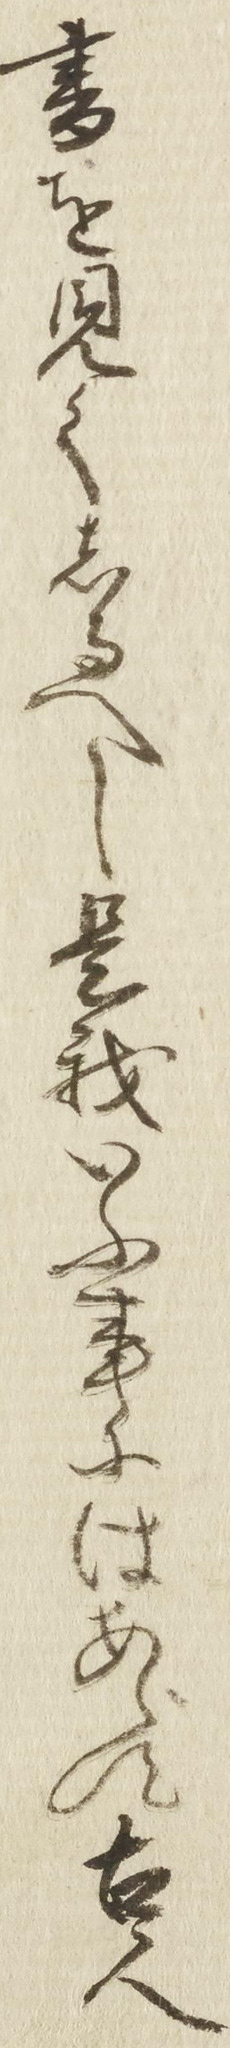書を見てしるへし是我いふ事にはあらす古人
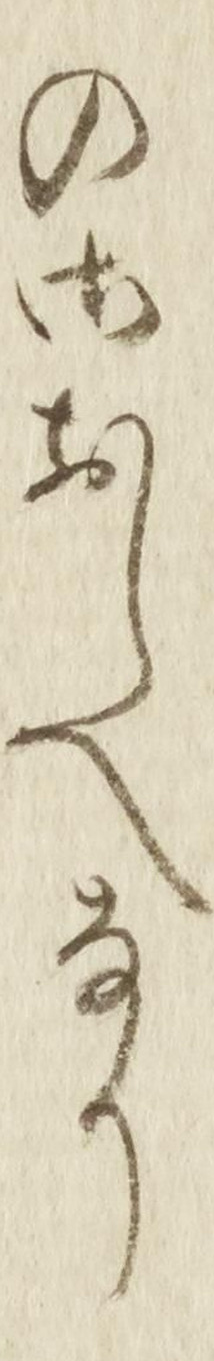の御おしへなり

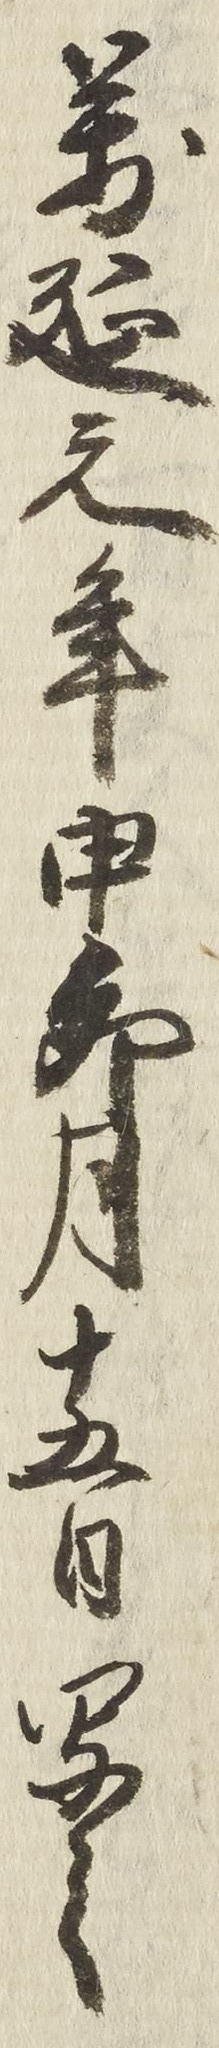萬延元年申卯月十五日写之
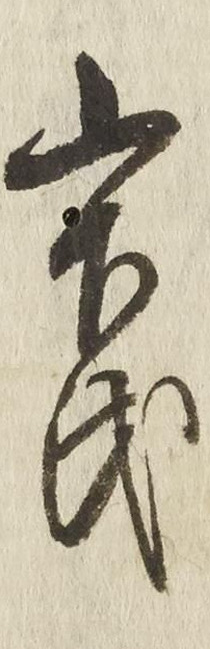山下氏
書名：天明奇畧　全
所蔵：東京大学地震研究所図書室 Earthquake Research Institute Library, The University of Tokyo, JAPAN
